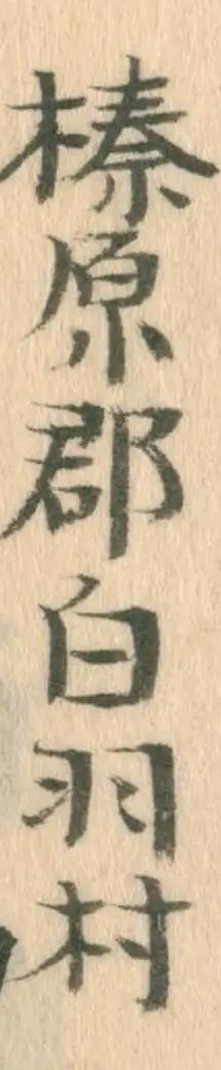榛原郡白羽村
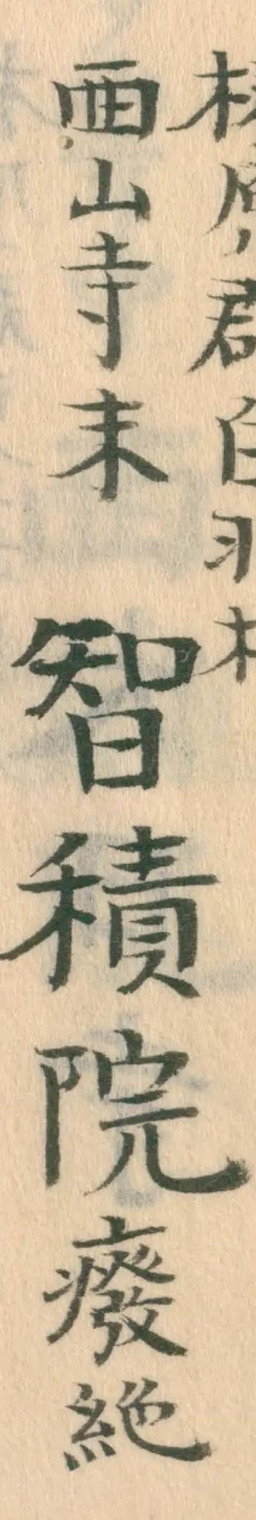西山寺未智積院廃絶
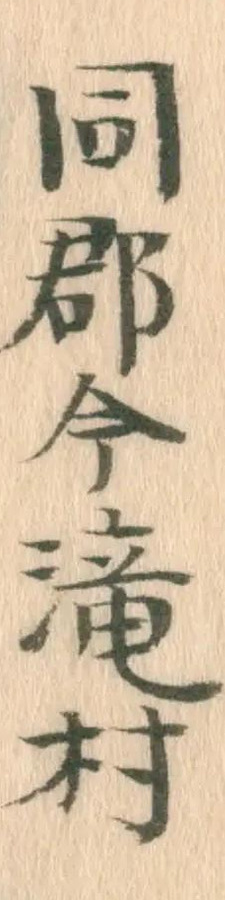同郡高瀬村
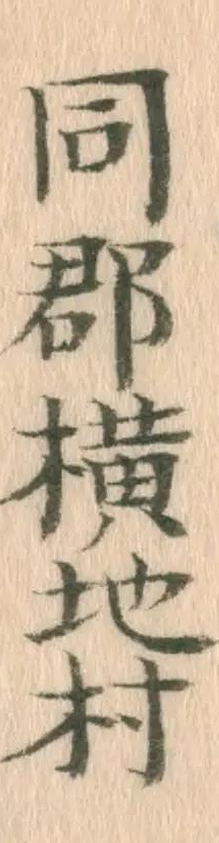同郡高瀬村
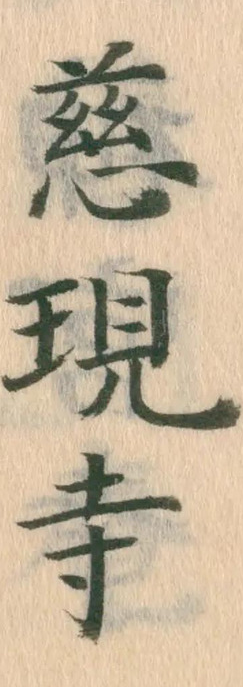慈現寺
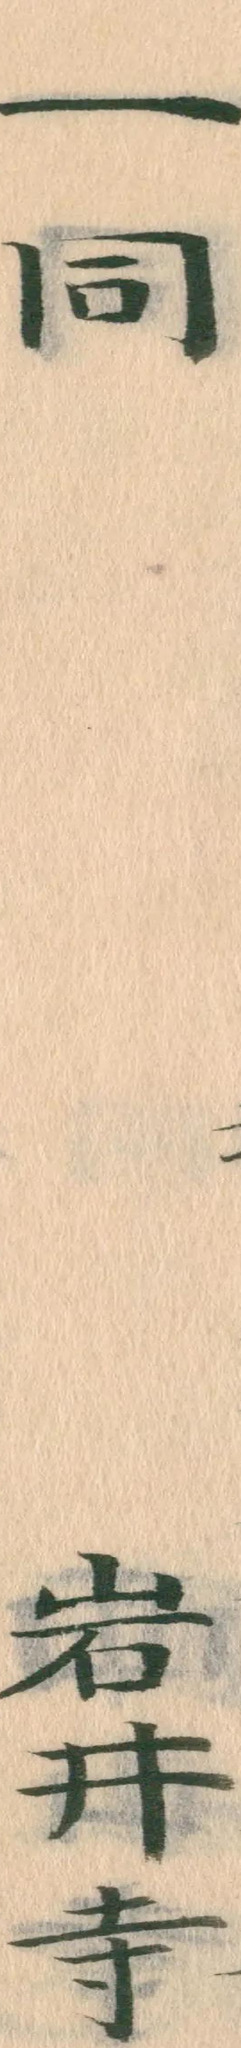一同岩井寺
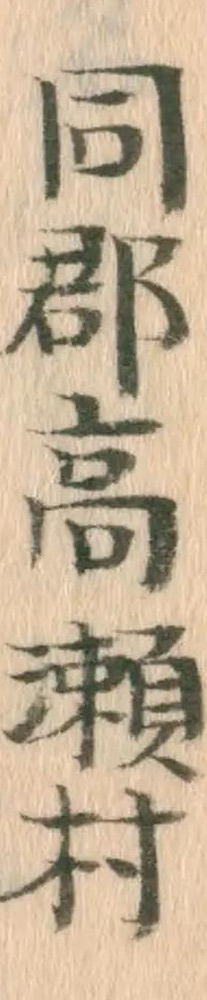同郡高瀬村
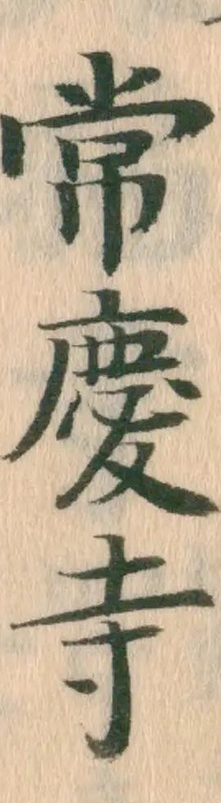常慶寺
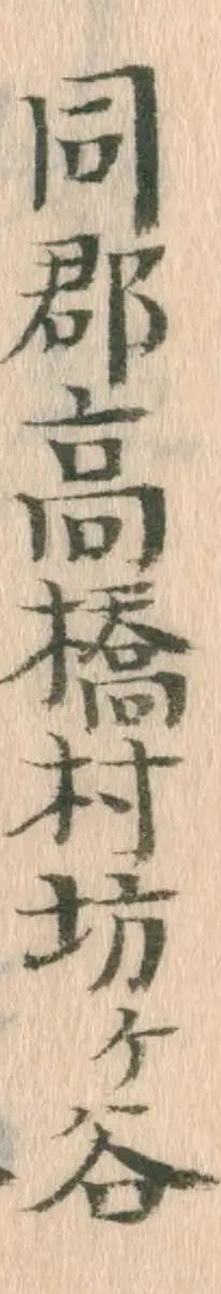同郡高橋村坊ケ谷
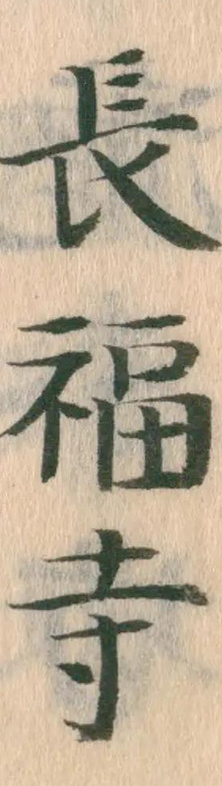長福寺
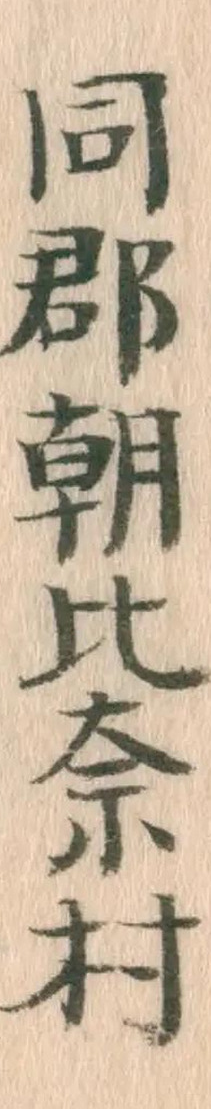同郡朝比奈村
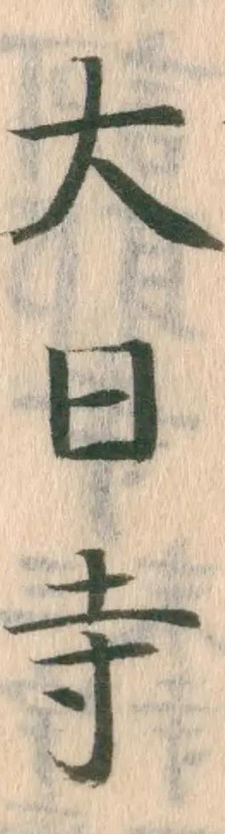大日寺
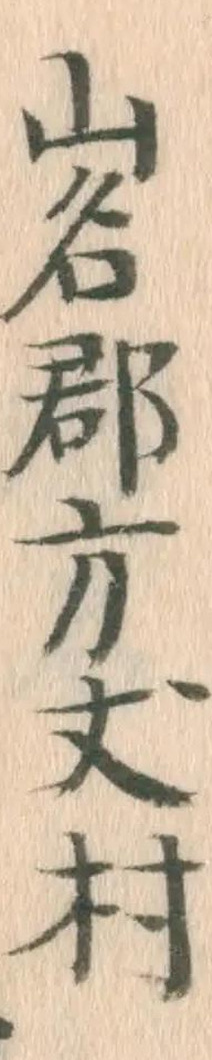山名郡方丈村

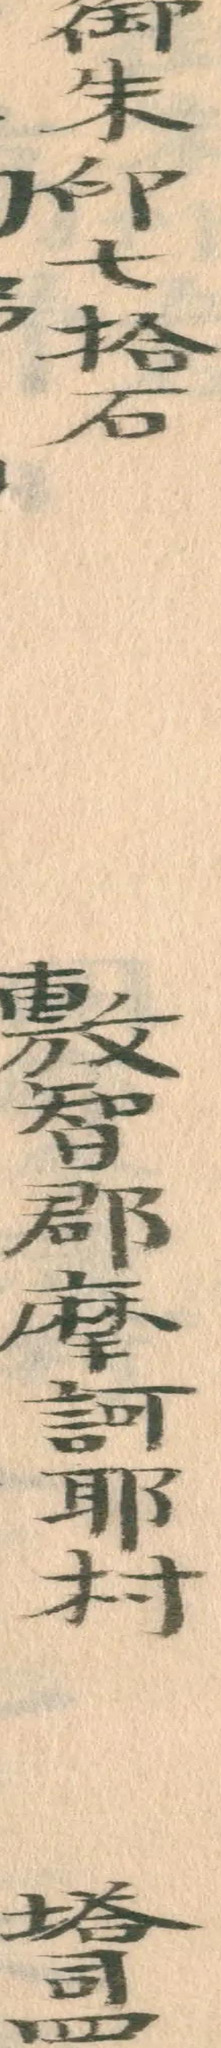御朱印七拾石敷智郡摩訶耶村塔司四宇内
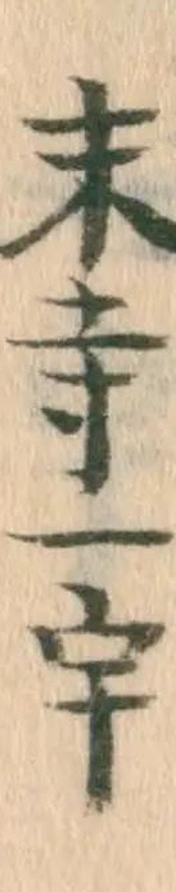未寺一宇
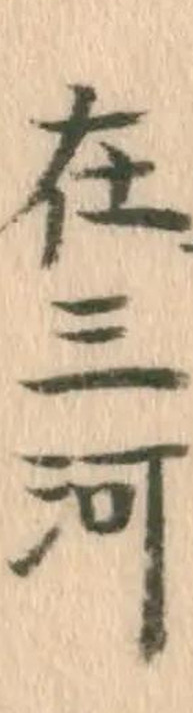在三河
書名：古義真言宗本末帳 21巻. [4] 第三 伊賀国、伊勢国、志摩国、尾張国、三河国、遠江国、駿河国、伊豆国、甲斐国
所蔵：国立国会図書館 National Diet Library, JAPAN
